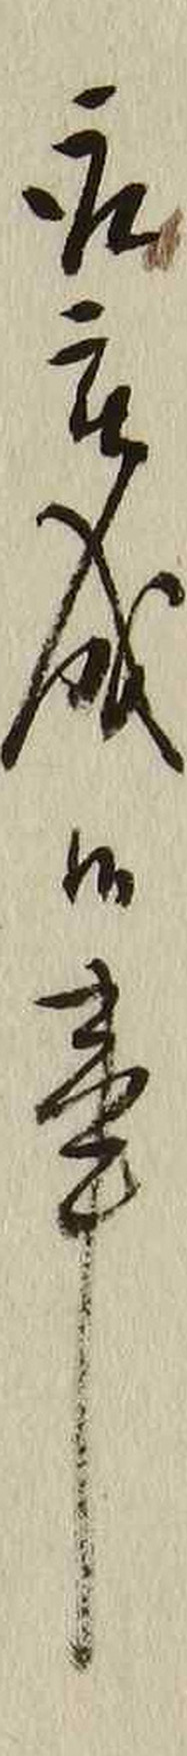取被成候事
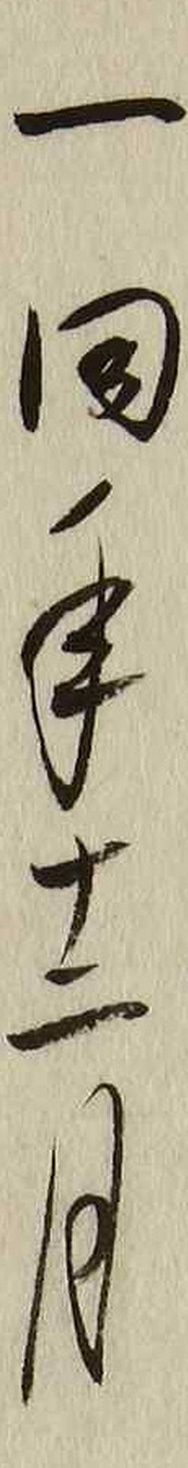一同年十二月
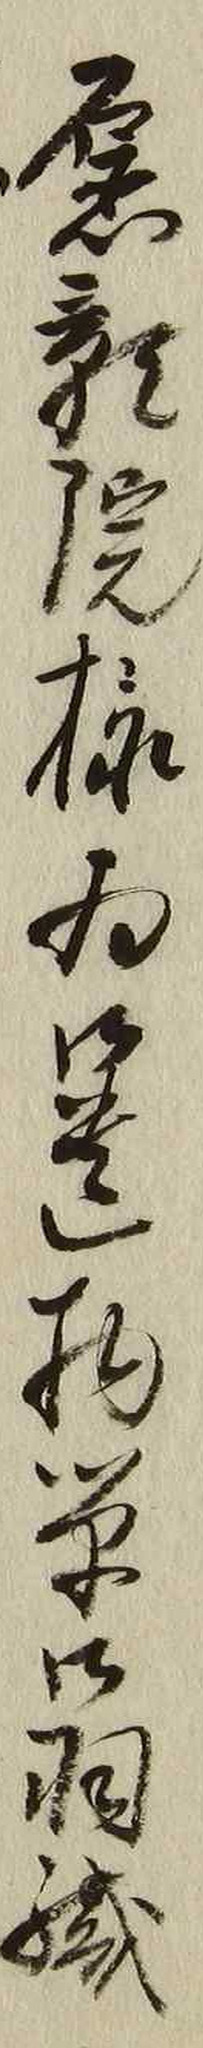愿彰院様為遺物単御羽織
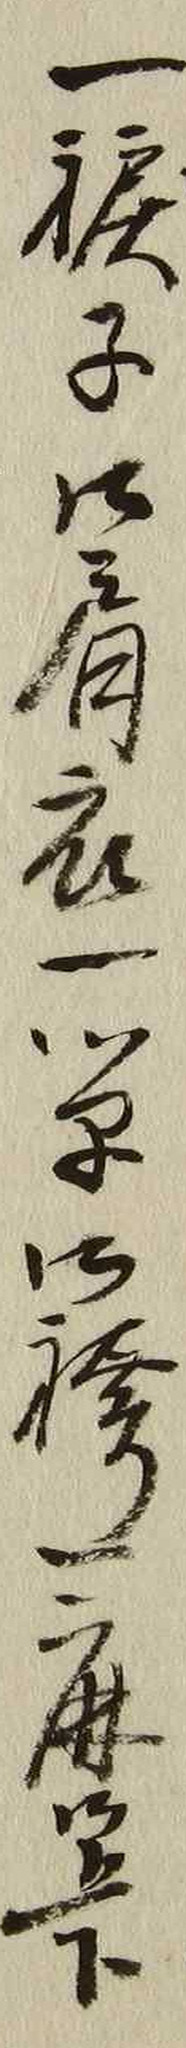一子御肩衣一単御袴一麻御上下
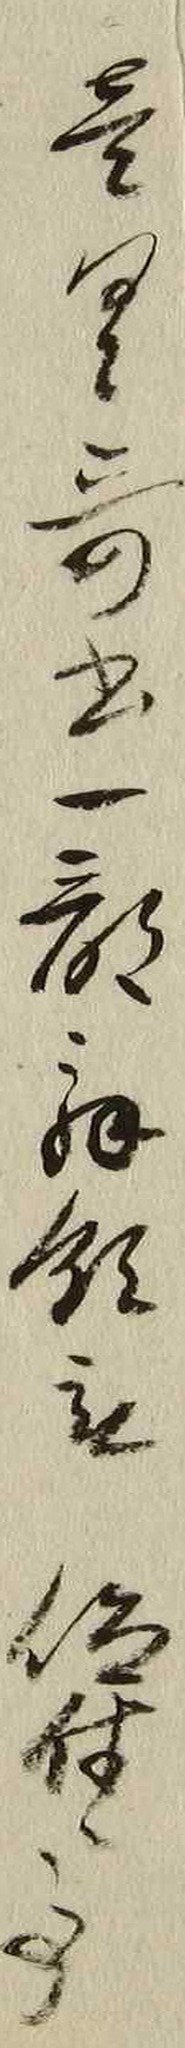壱具歌書一部拝領被仰付候事
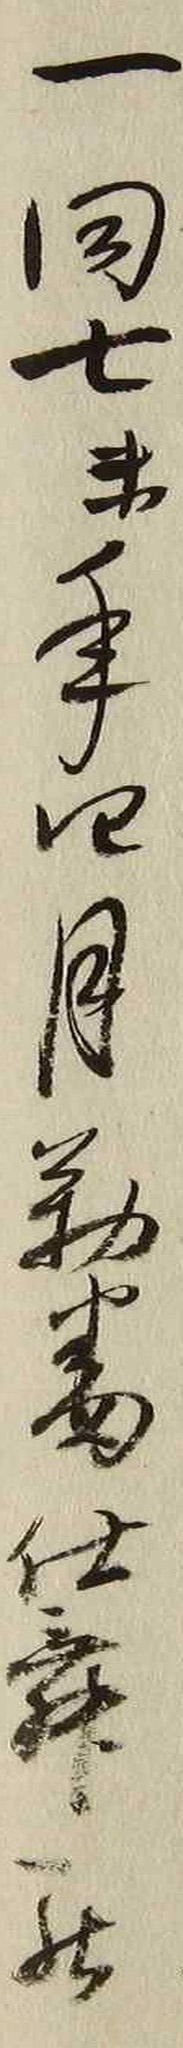一同七未年四月勤番仕舞罷
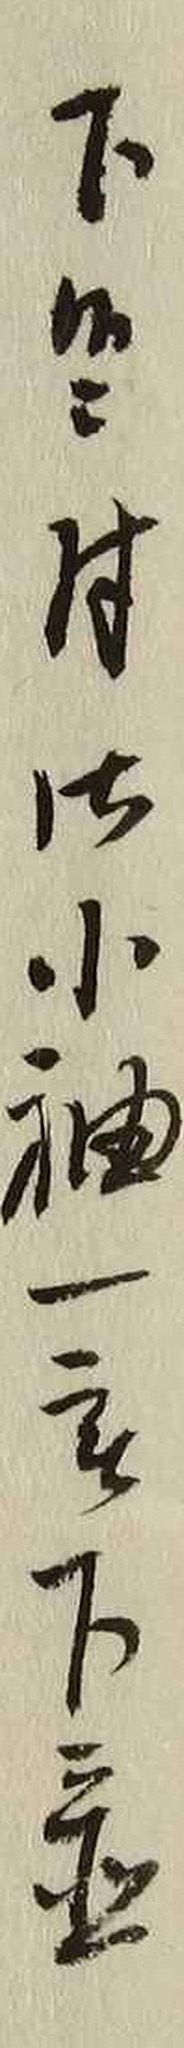下候ニ付御小袖一被下置
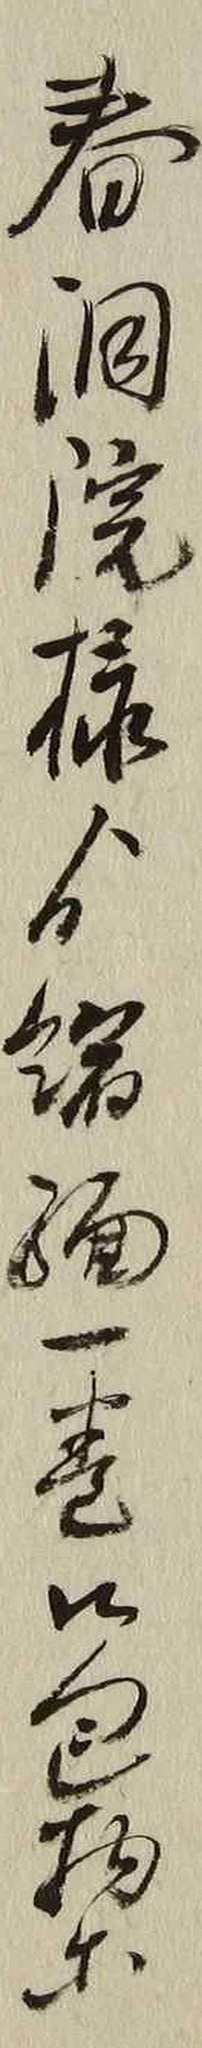春洞院様ゟ縮緬一巻御包物等
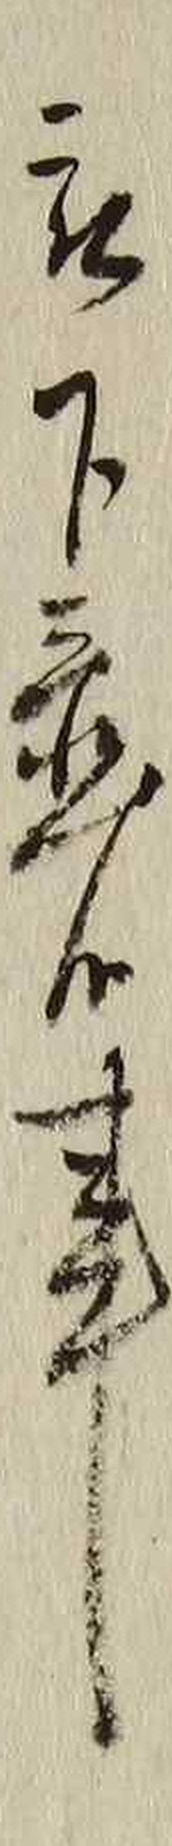被下置候事
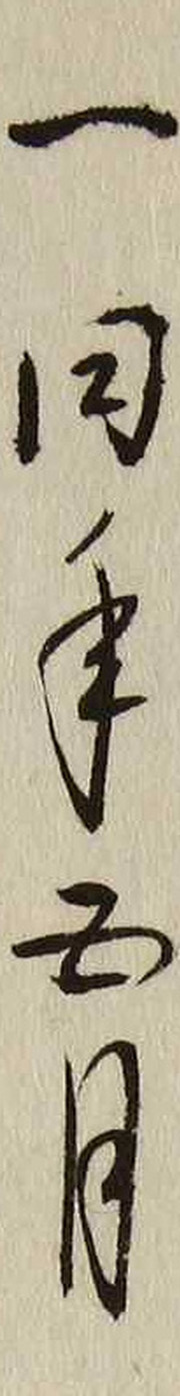一同年五月
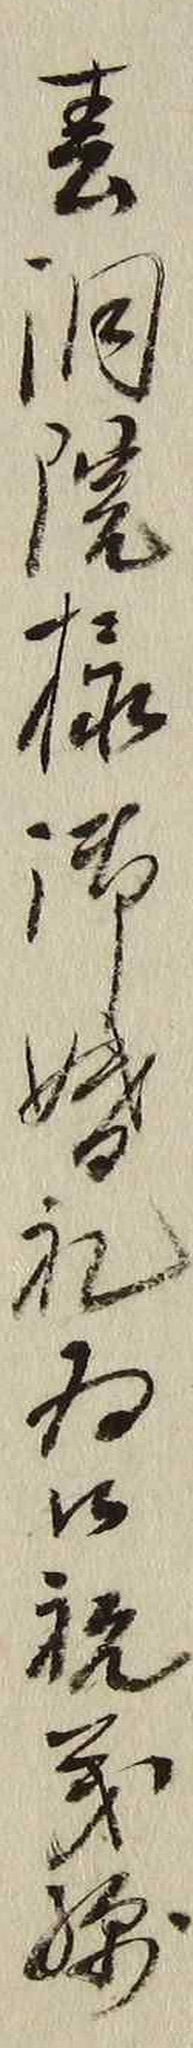春洞院様御婚礼為御祝義綿
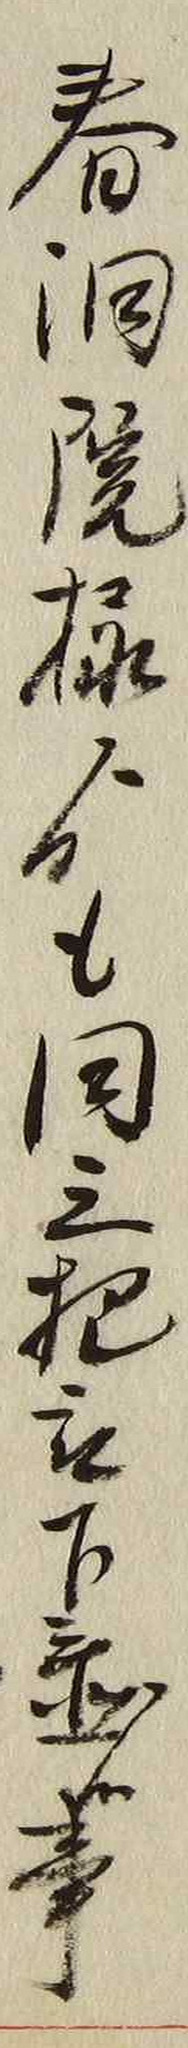春洞院様ゟも同三把被下置候事
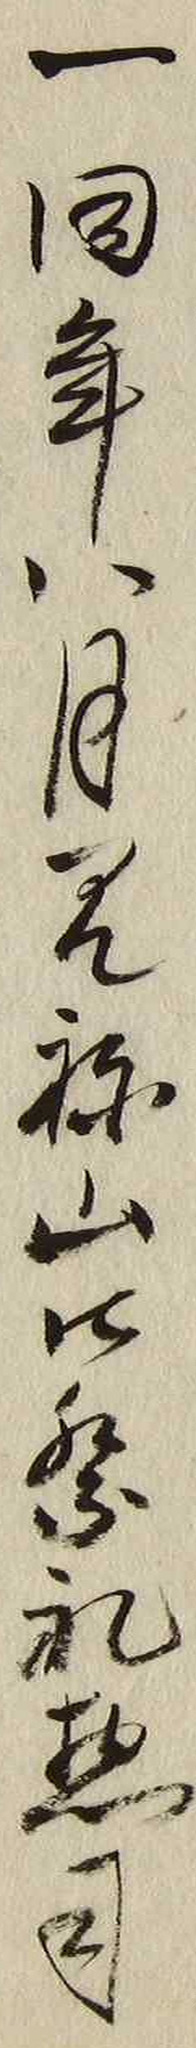一同年八月見禰山御祭礼惣司
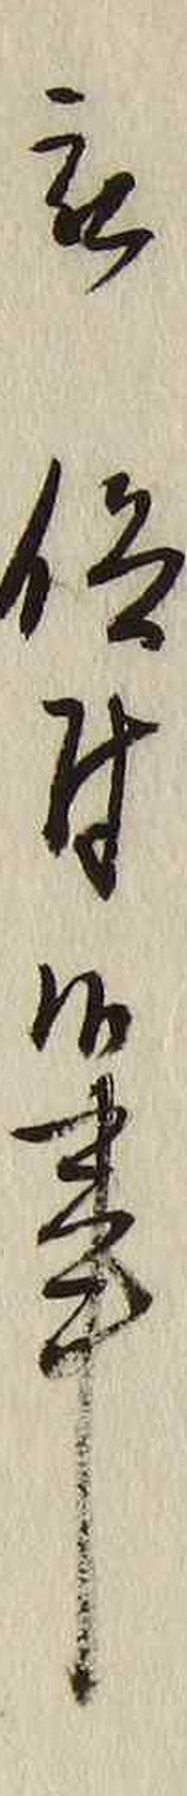被仰付候事
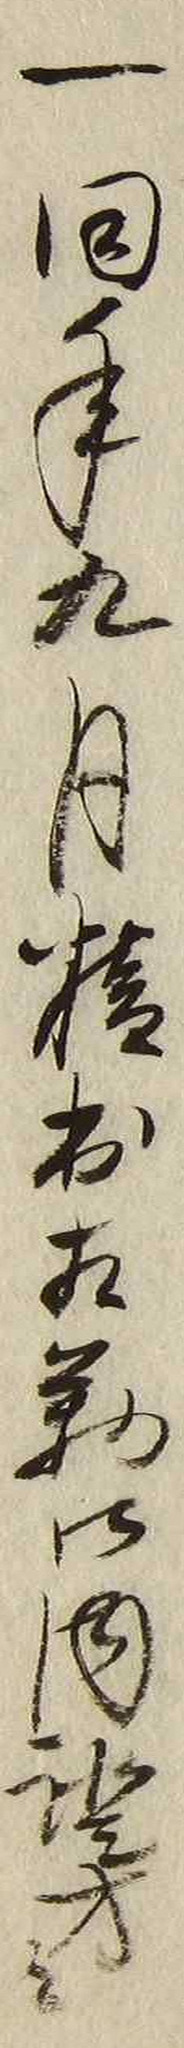一同年九月精出相勤御内証方之

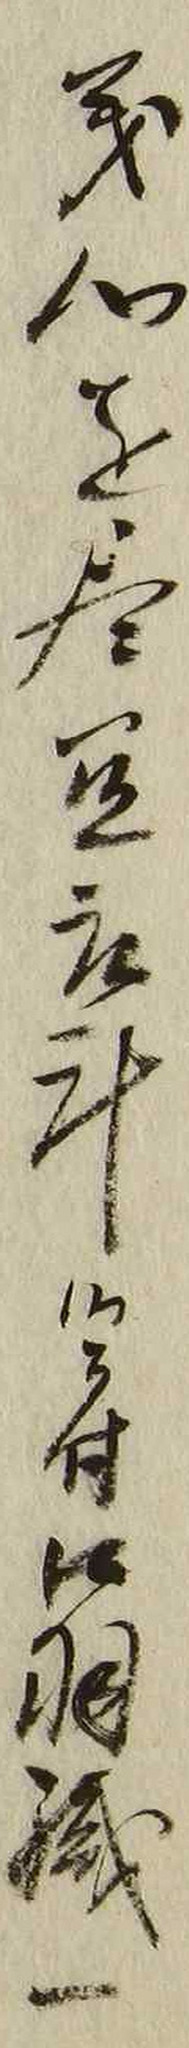義心を尽宜取計候ニ付御羽織一
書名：諸士系譜　巻之351　す之部1
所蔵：会津若松市立会津図書館
